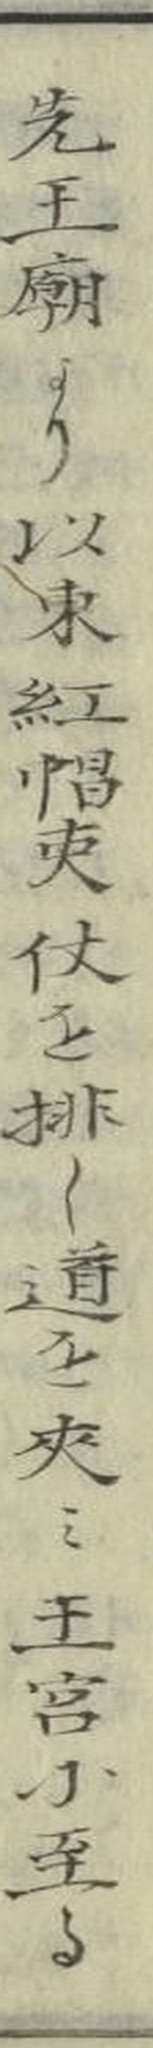先王廟より以東紅帽吏仗を排し道を夾み王宮に至る

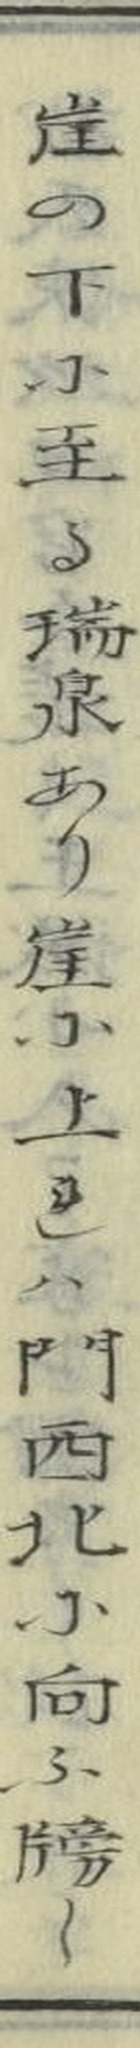崖の下に至る瑞泉あり崖に上れは門西北に向ふ牓し
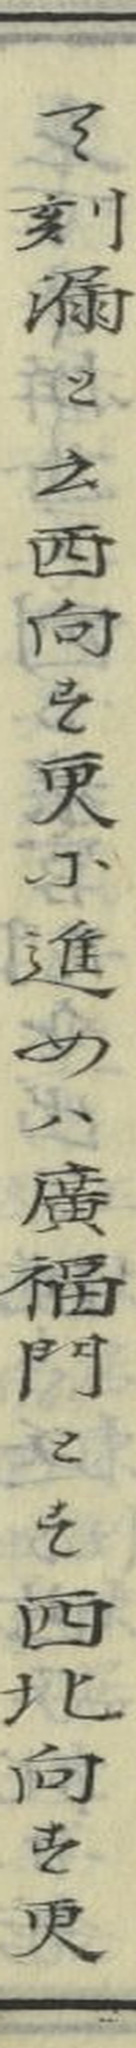て刻漏と云西向す更に進めは広福門とす西北向す更
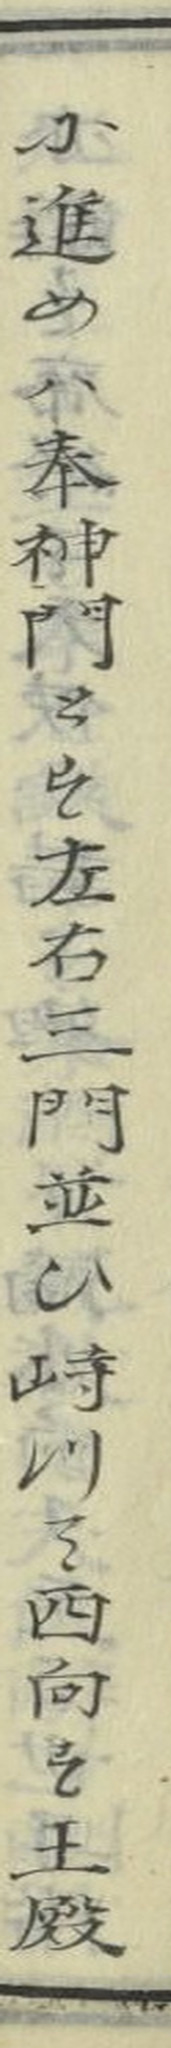に進めは奉神門とす左右三門並ひ峙つて西向す王殿
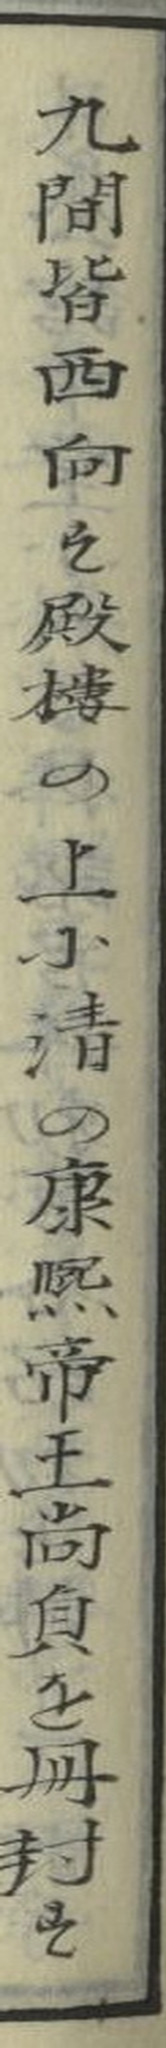九間皆西向す殿楼の上に清の康煕帝王尚貞を冊封す
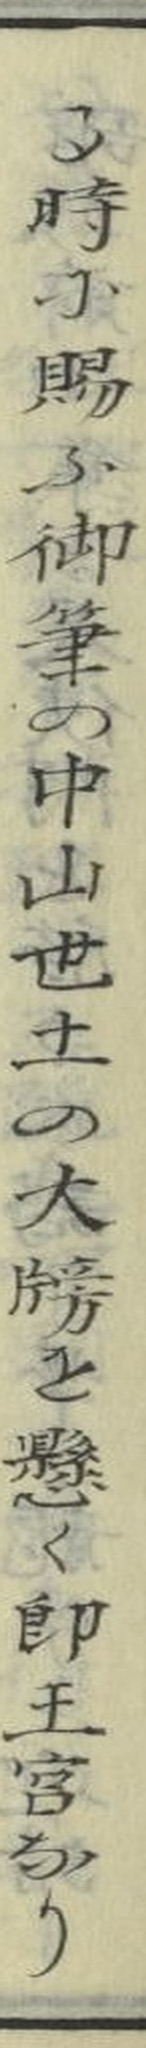る時に賜ふ御筆の中山世土の大牓を懸く即王宮なり
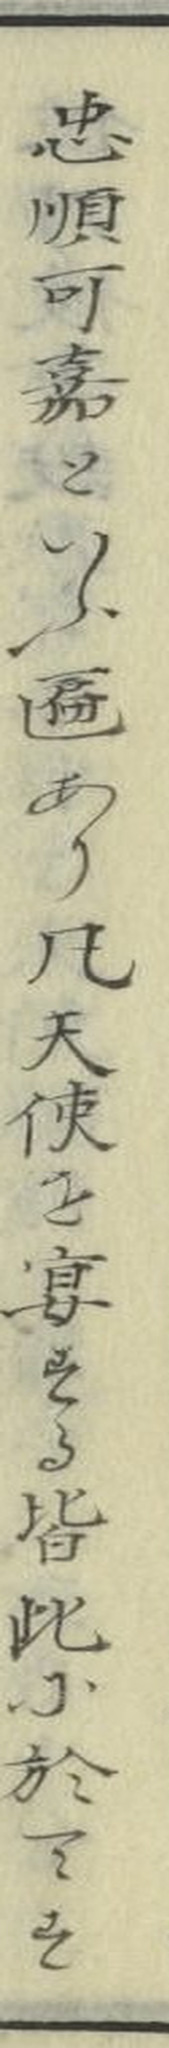忠順可嘉といふ匾あり凡天使を宴する皆此に於てす
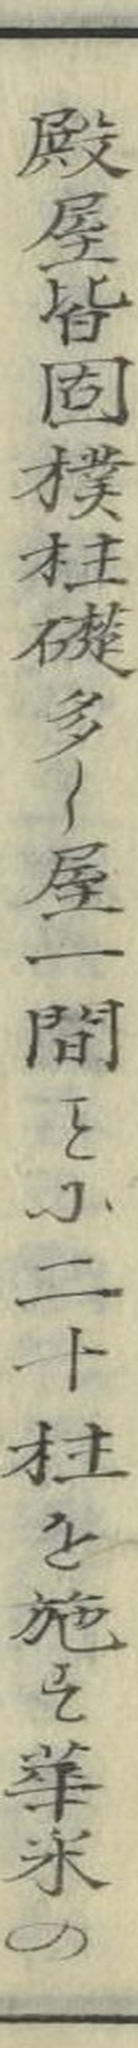殿屋皆固樸柱礎多し屋一間ことに二十柱を施す華采の
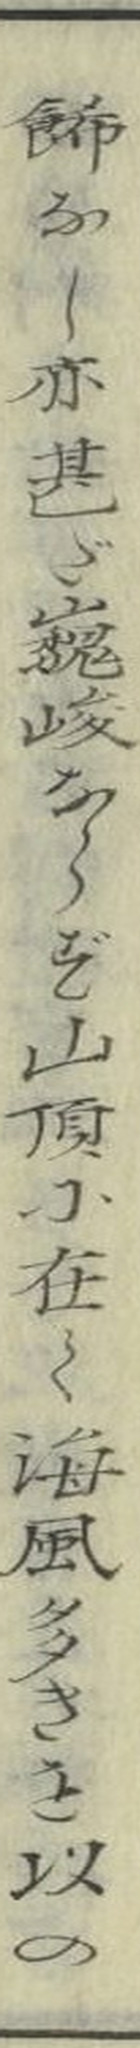飾なし亦甚だ巍峻ならず山頂に在て海風多きを以の
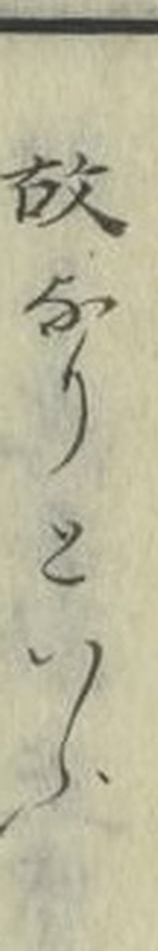故なりといふ
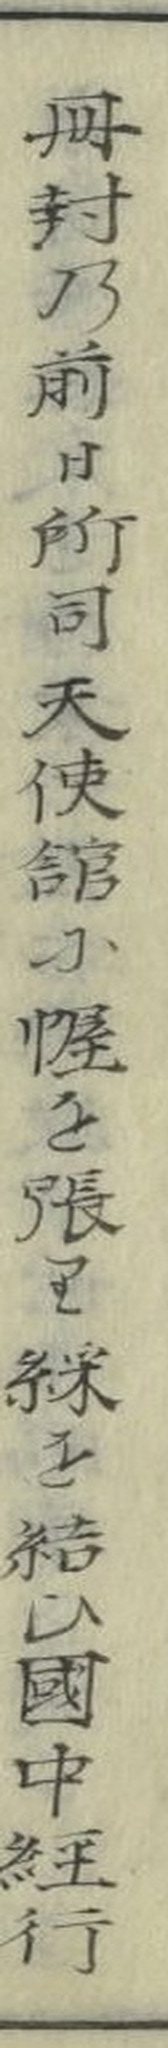冊封の前日所司天使館に幄を張り綵を結ひ国中経行
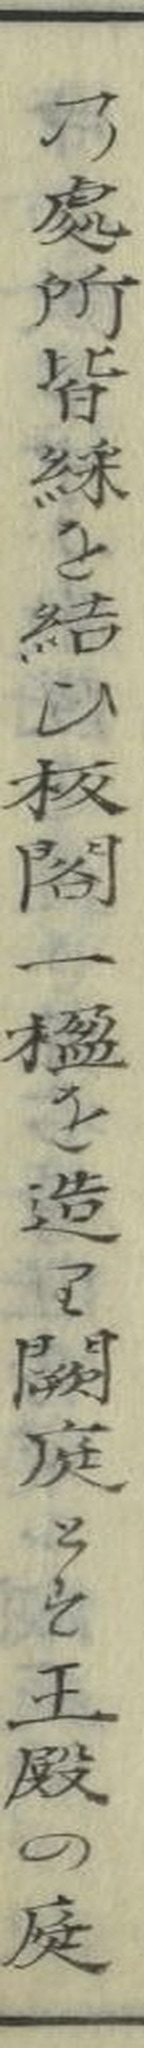の処所皆綵を結ひ板閣一楹を造り闕庭とす王殿の庾

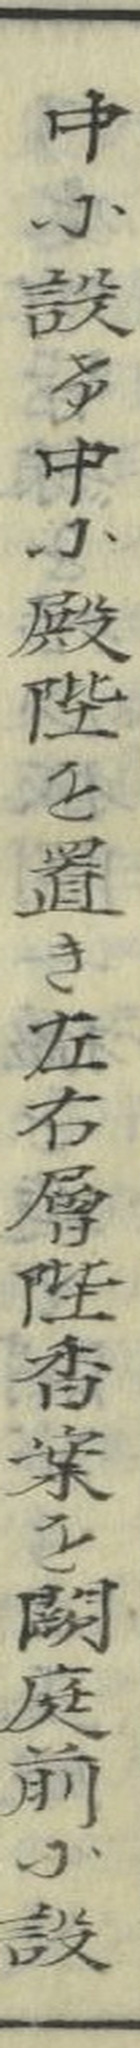中に設け中に殿陛を置き左右層陛香案を闕庭前に設
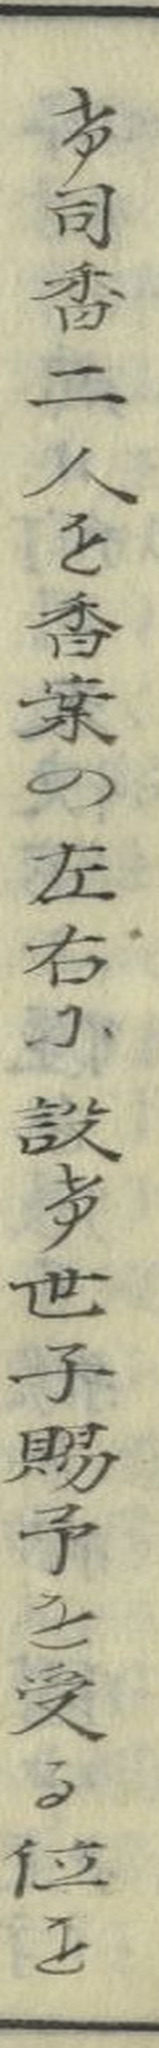け司香二人を香案の左右に設け世子賜予を受る位を
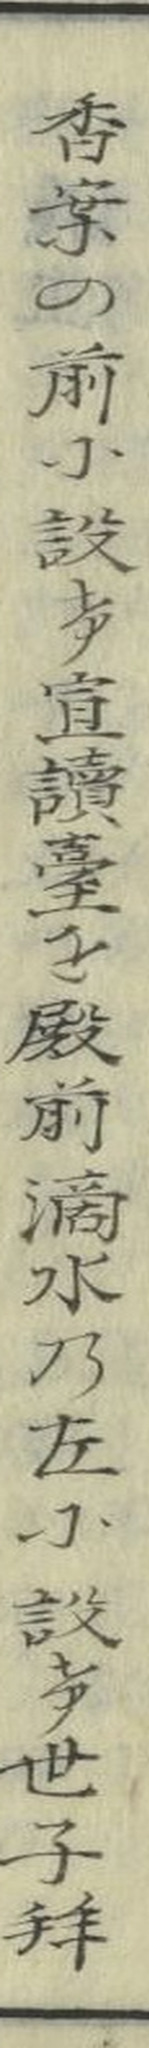香案の前に設け宣読台を殿前滴水の左に設け世子拝
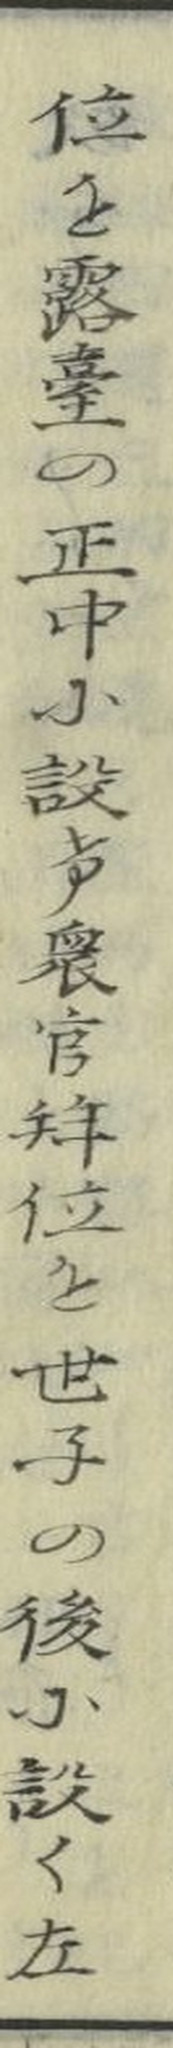位を露台の正中に設け衆官拝位を世子の後に設く左
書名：琉球沿革志 下
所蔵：University of the Ryukyus Library
